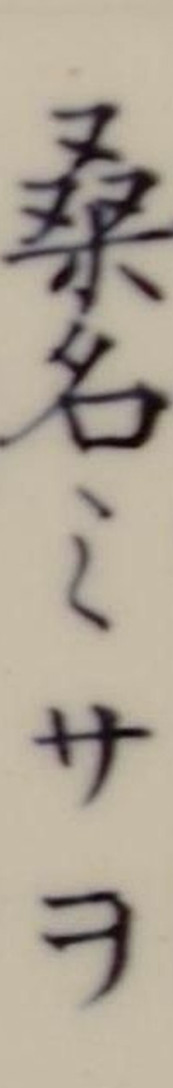桑名之サヲ
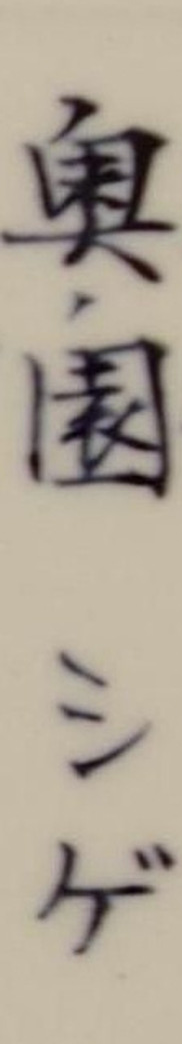奥園シゲ
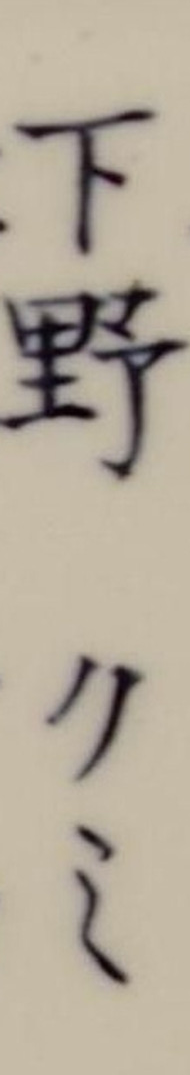下野クミ
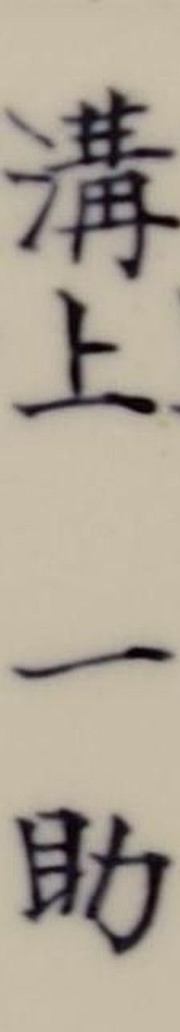溝上一助
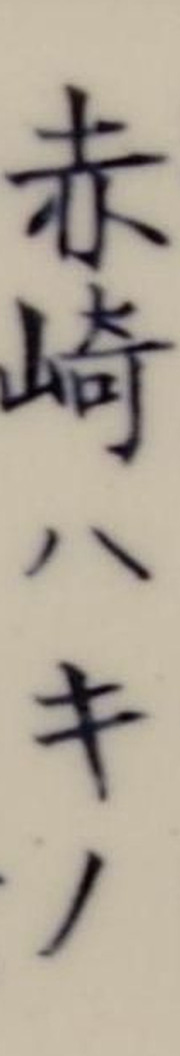赤崎ハキノ
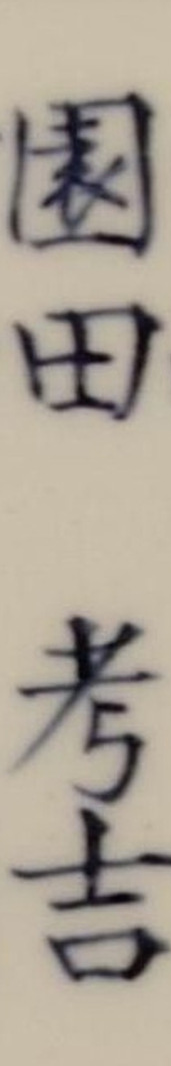園田考吉
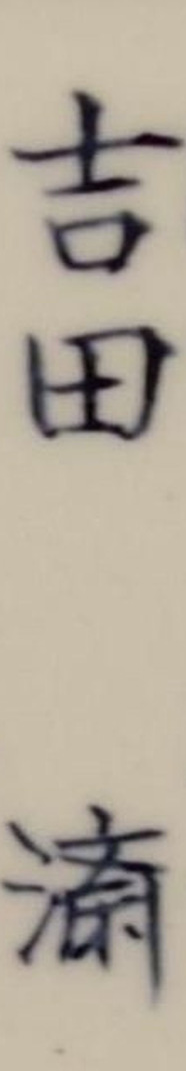吉田済
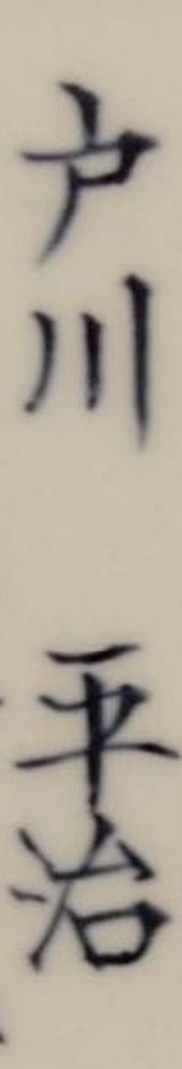戸川平治
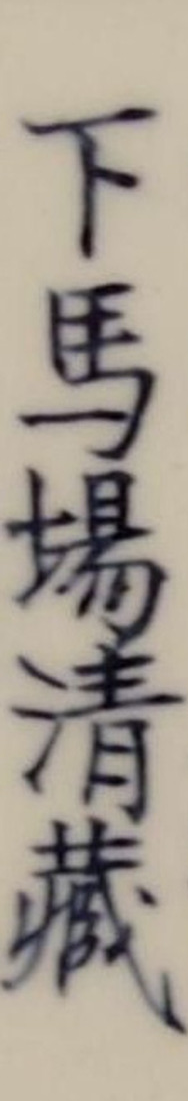下馬場清蔵
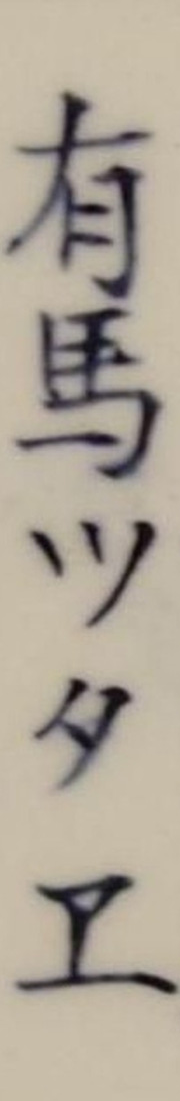有馬ツタヱ
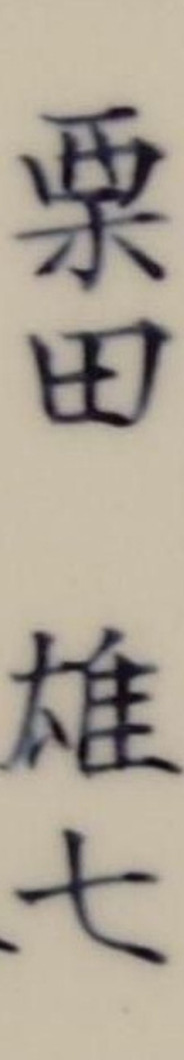栗田雄七
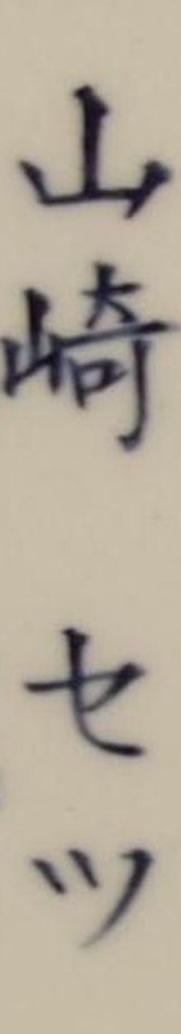山崎セツ
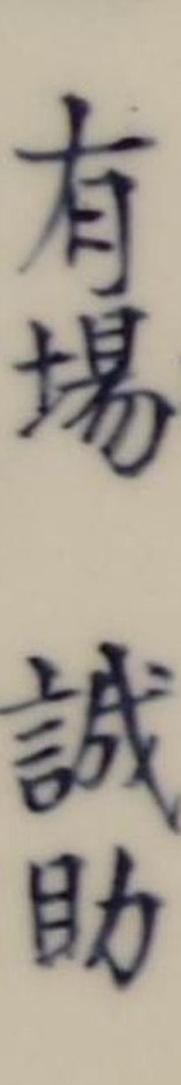有場誠助
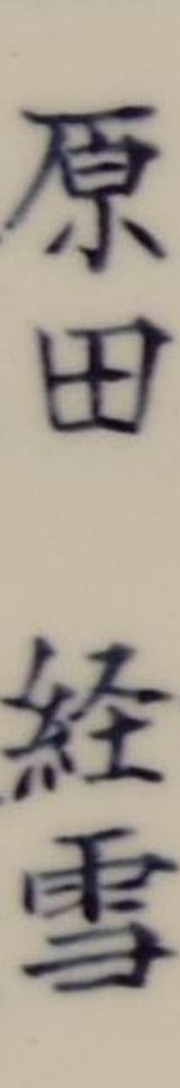原田経雪
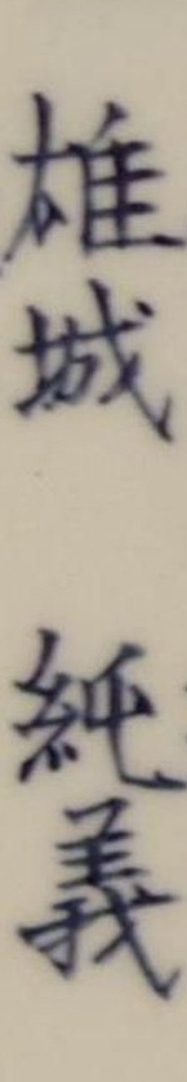雄城純義
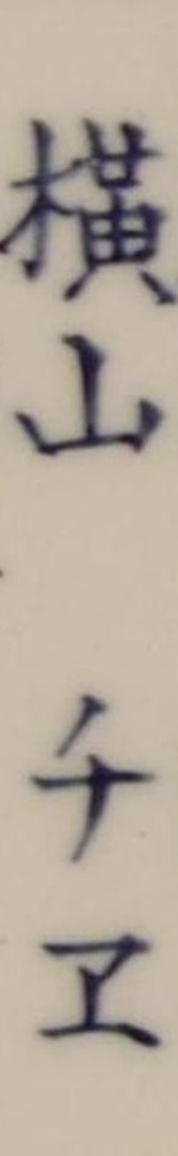横山チヱ
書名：E~L
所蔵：高野山金剛峯寺
